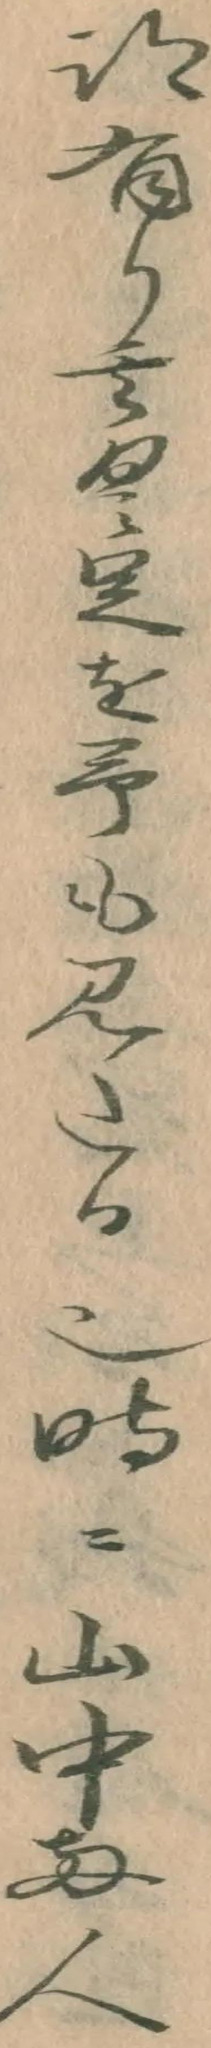跡有り其具足を予も見たる也時に山中両人
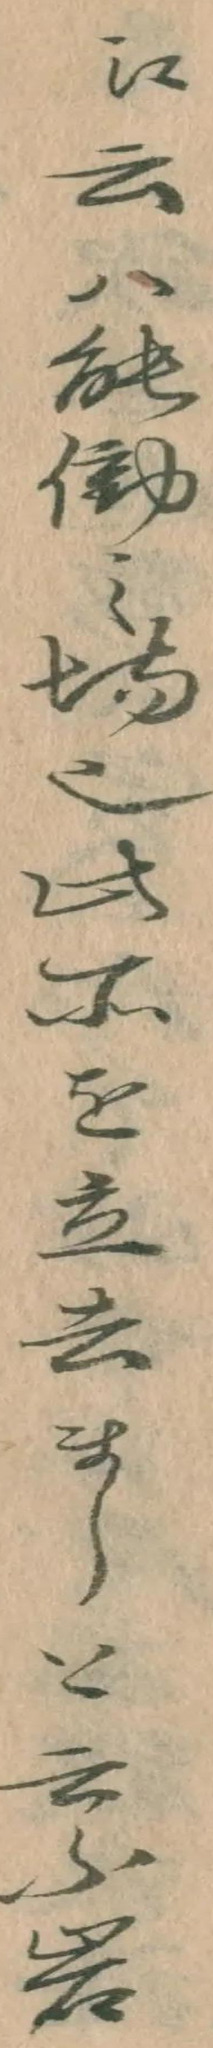江云は能働之場也此所を立去ましと云ふ岩
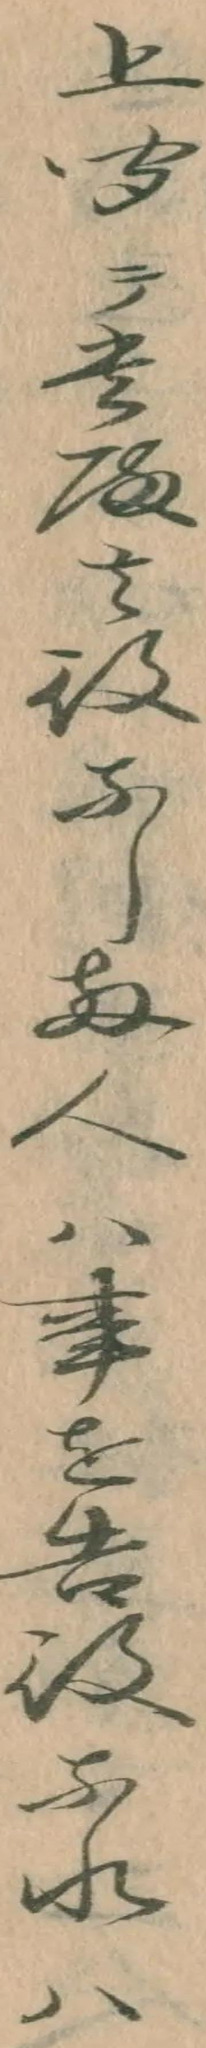上聞て貴殿者役なし両人は事を告役なれは
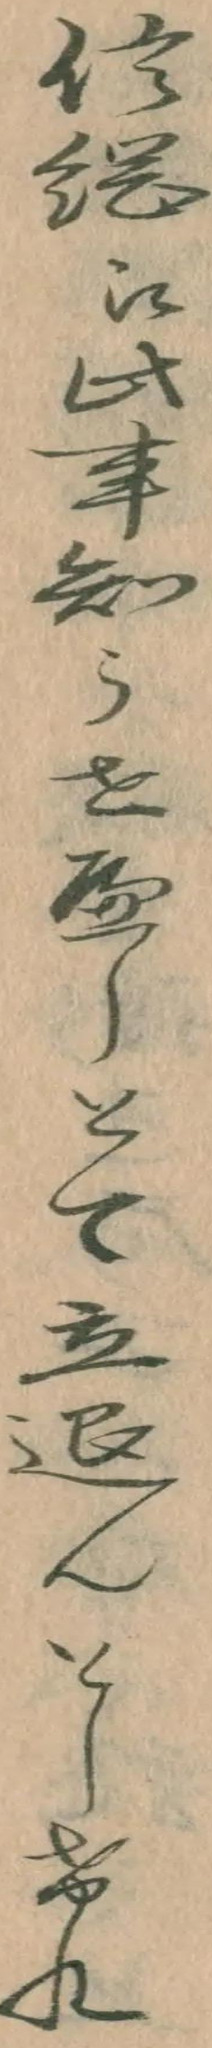信綱江此事知らせ扁しとて立退んとし希れ
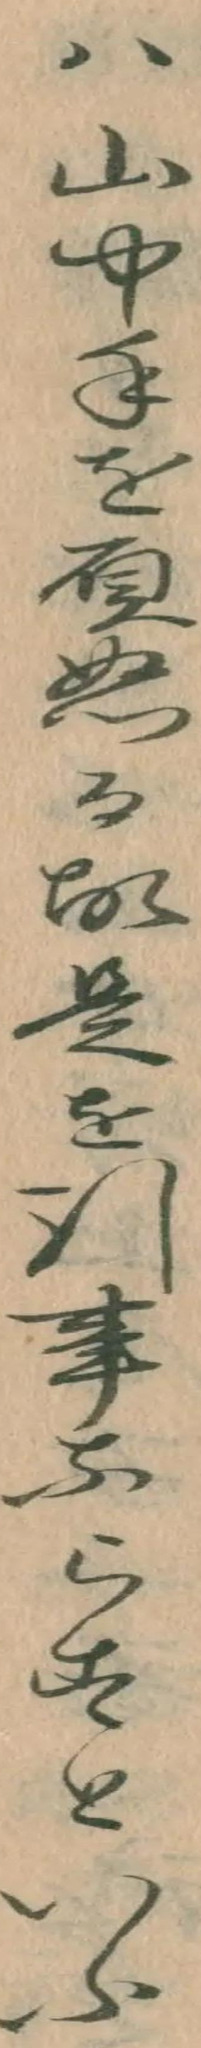は山中手を負怒る故是を引事なら春といふ
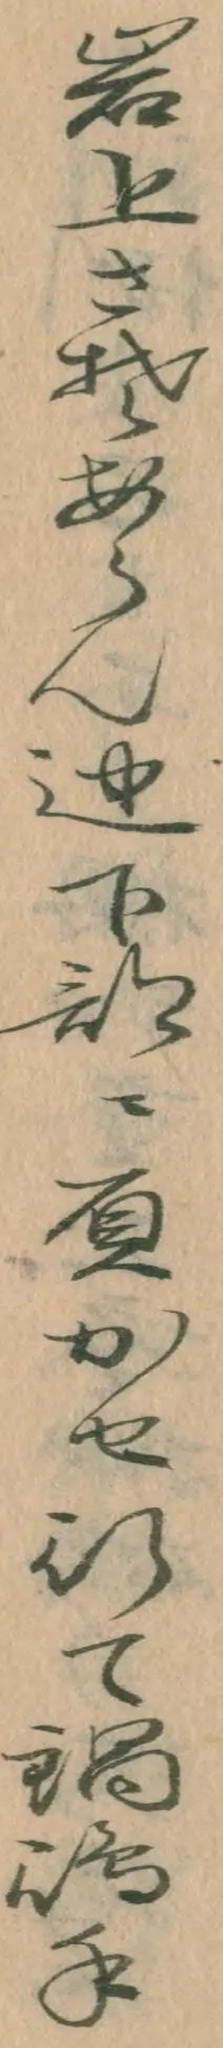岩上さ楚あらん迚下部に負かせ行て鍋島手
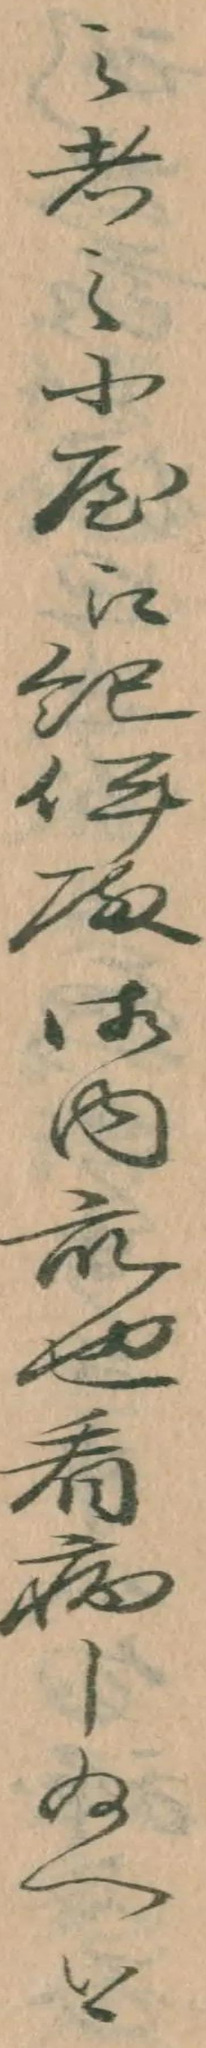之者之小屋江紀伊殿御内衆也看病しゐへと
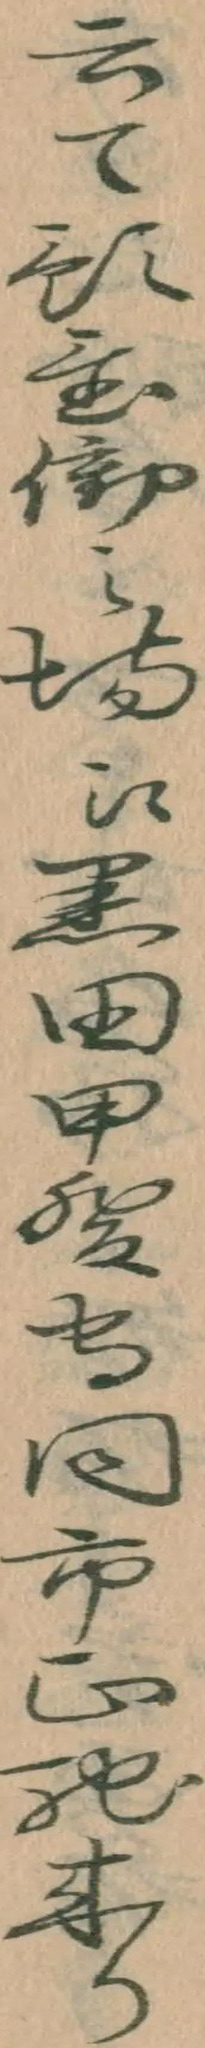云て預置働之場江黒田甲斐守同市正馳来り
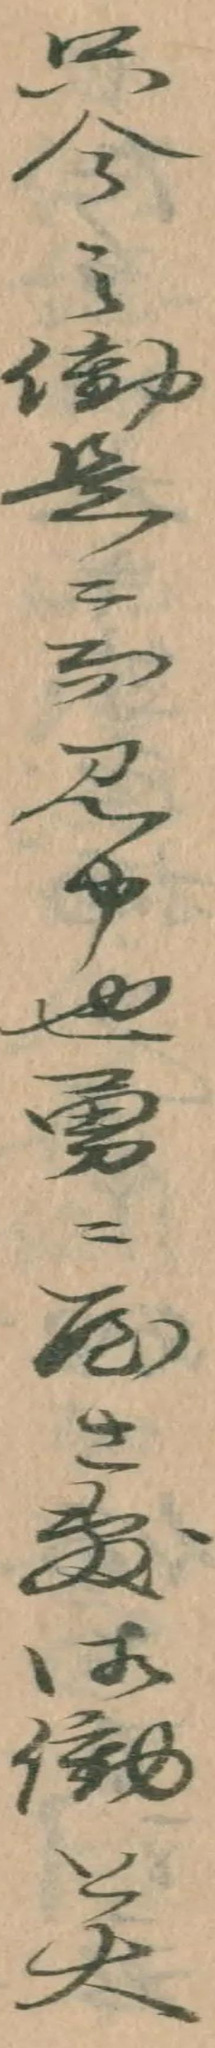只今之働是に而見申也勇に屋さ敷御働と大
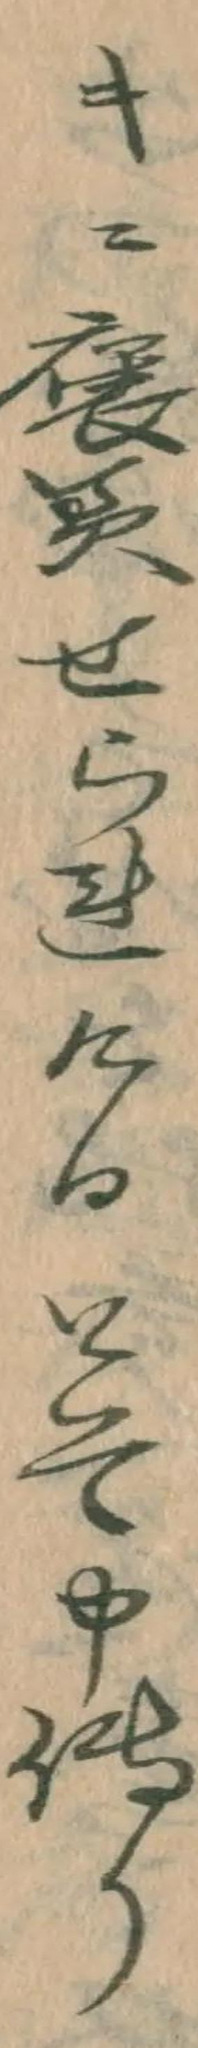きに褒美せら連けるとそ申伝り
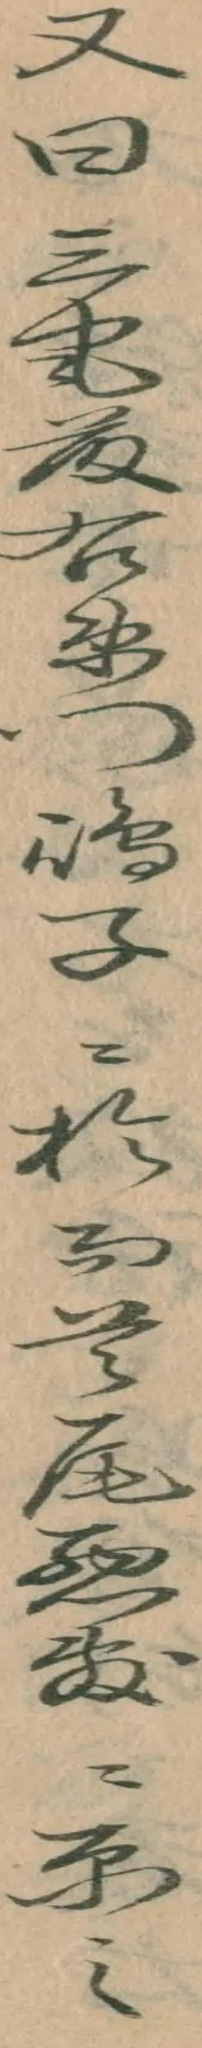又曰三宅藤右衛門島子に於而首尾悪敷に原之
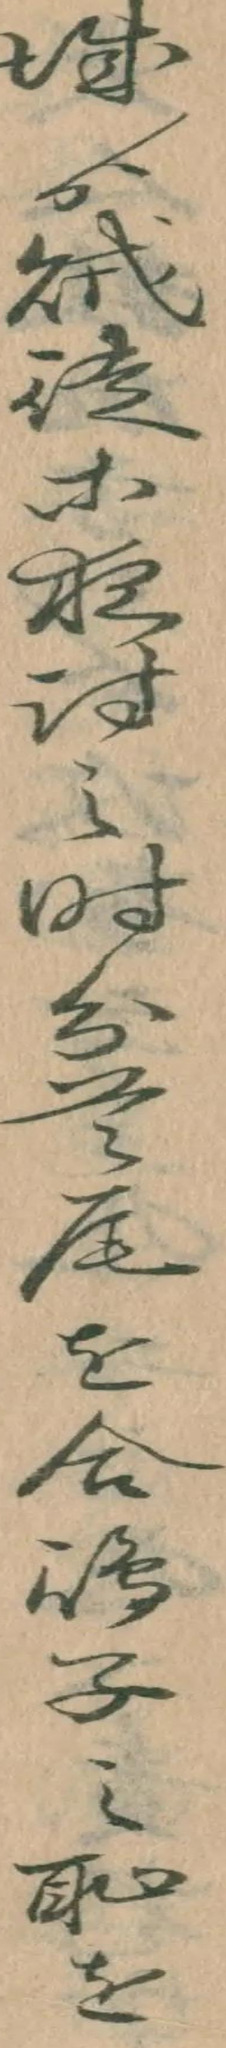城ゟ賊徒等夜討之時分首尾を合島子之恥を
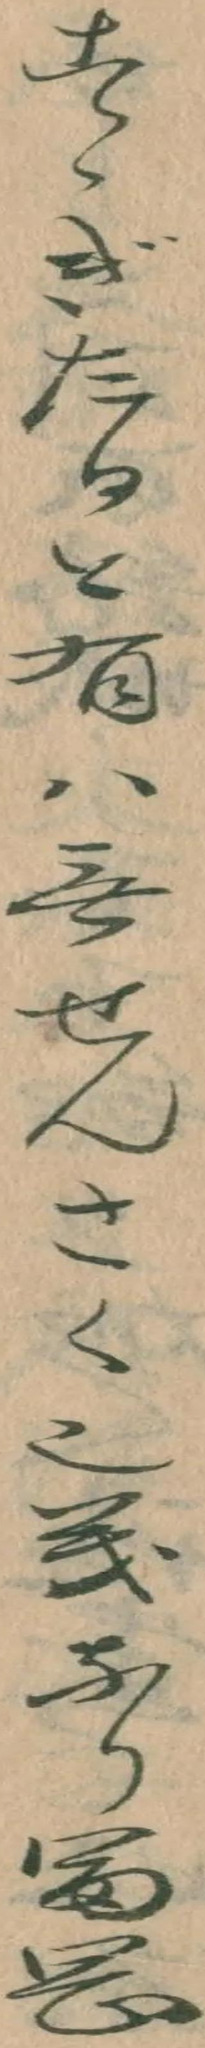春々ぎたると有は無せんさく也義なり冨岡
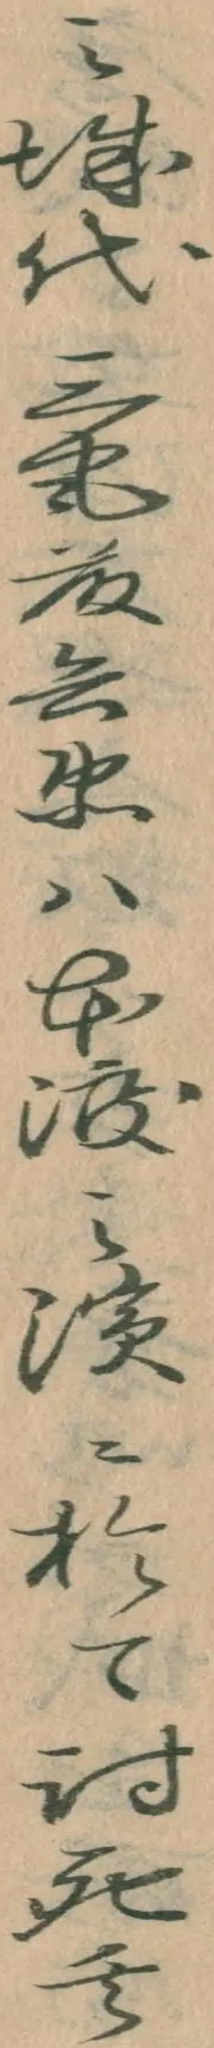之城代三宅藤兵衛は本渡之浜に於て討死其
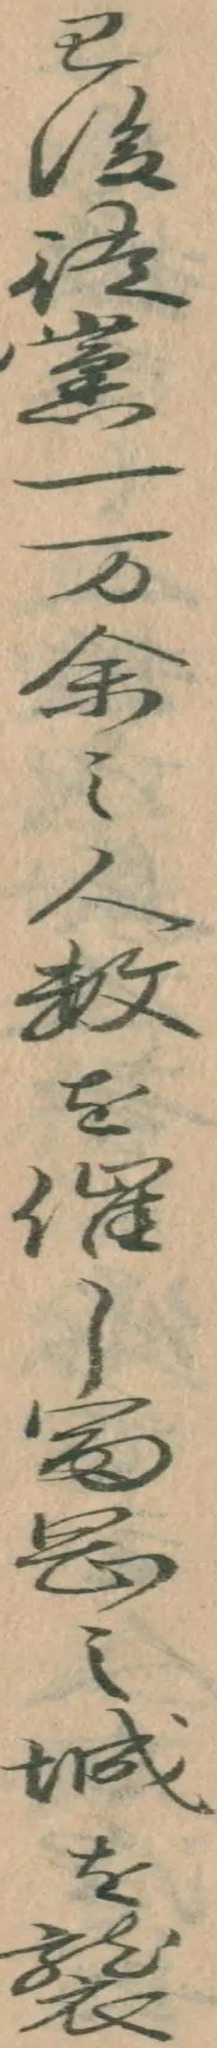已後徒党一万余之人数を催し冨岡之城を襲
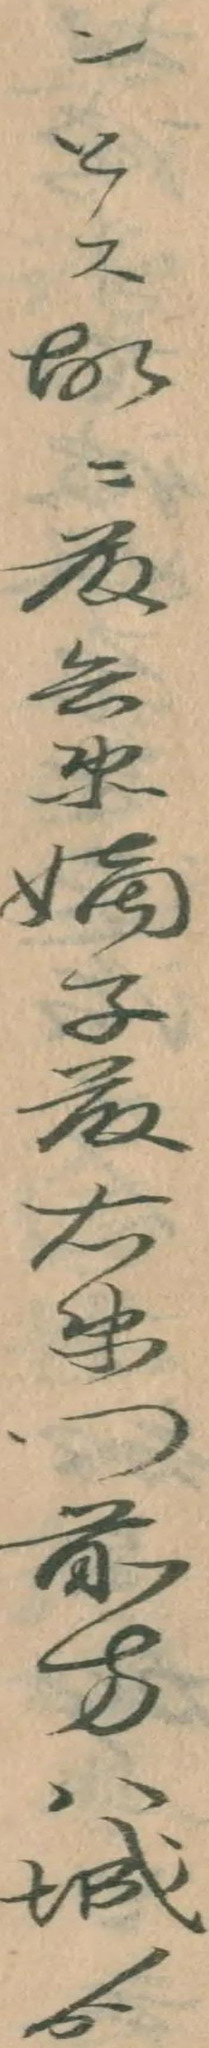んとす故に藤兵衛嫡子藤右衛門前方は城ゟ
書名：切支丹御退治記 49巻. [7]
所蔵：国立国会図書館 National Diet Library, JAPAN
